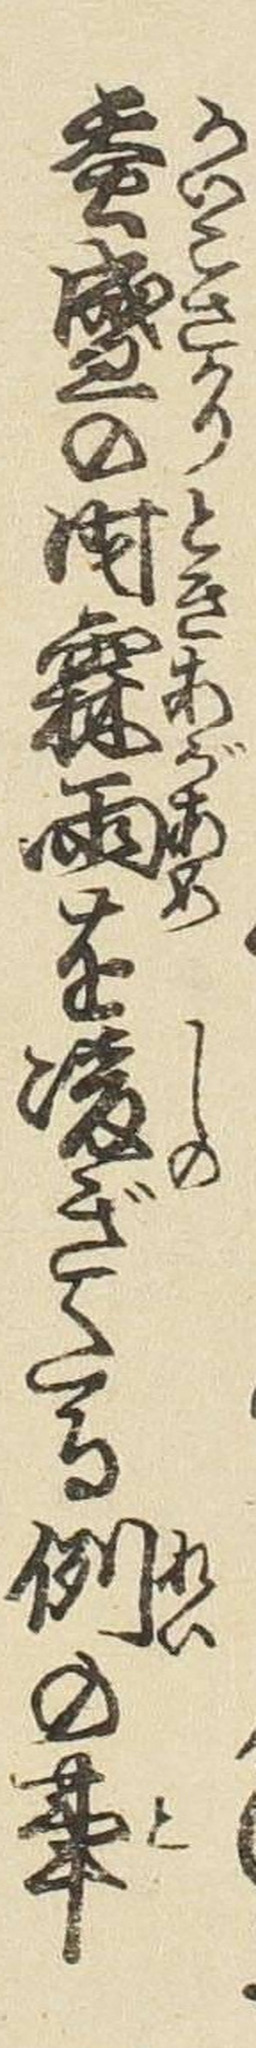蚕盛の時霖雨を凌ぎたる例の事
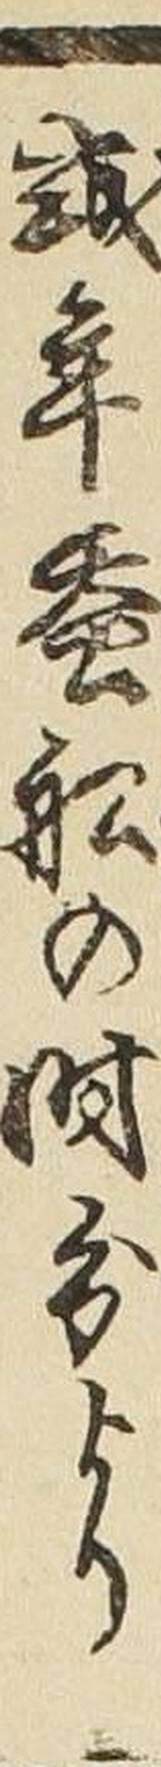或年蚕船の時分より
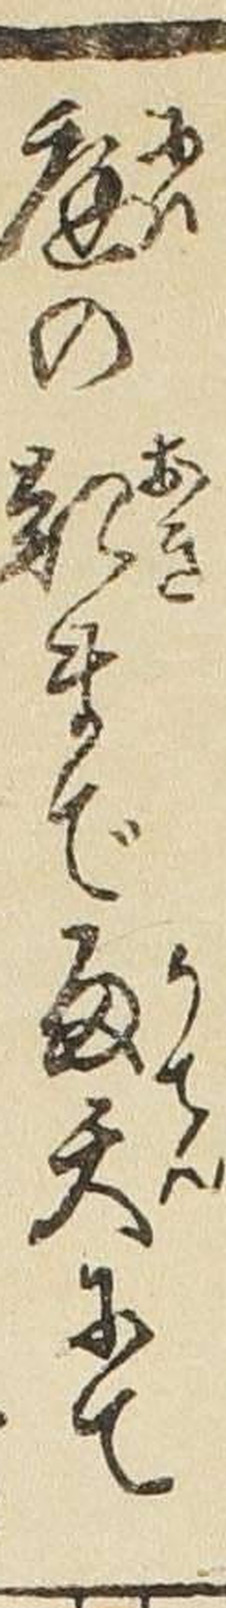庭の起まで雨天にて
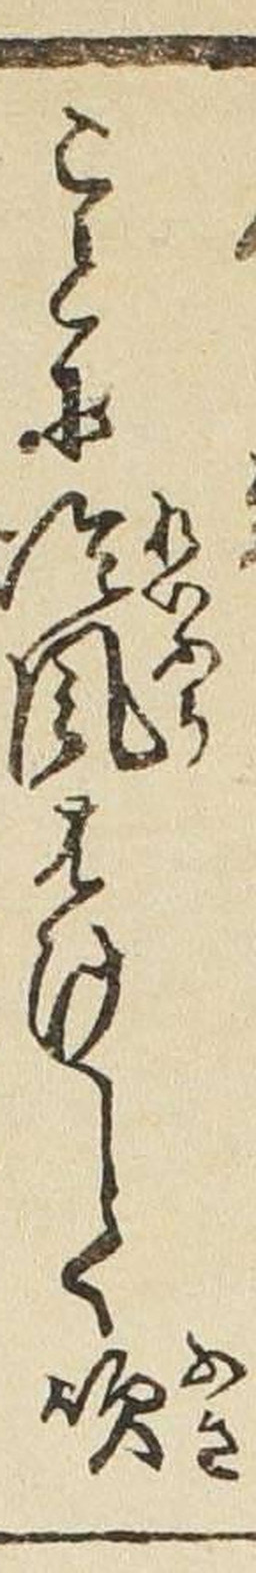ことに冷風はけしく吹
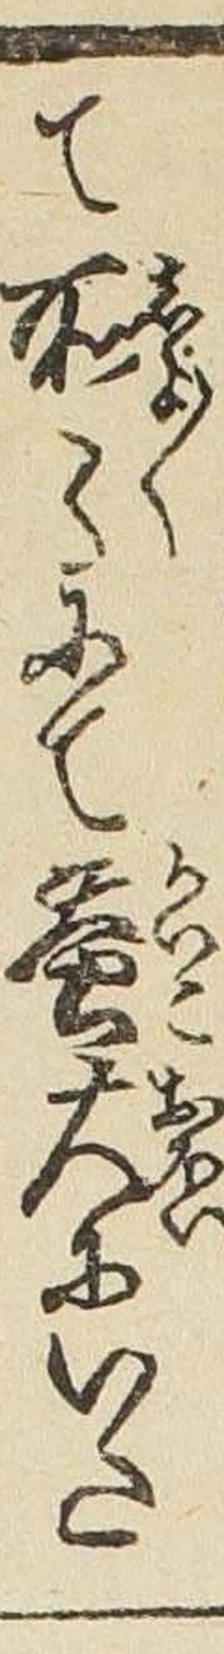て所々にて蚕大にいた
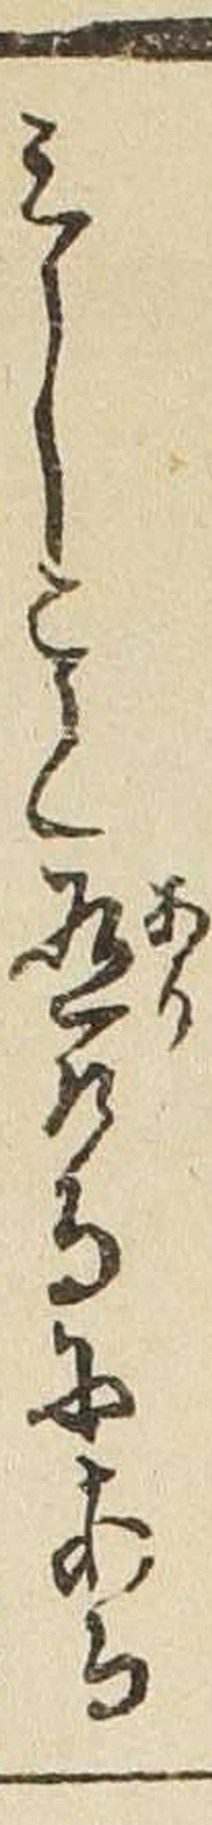みしこと有けるにある
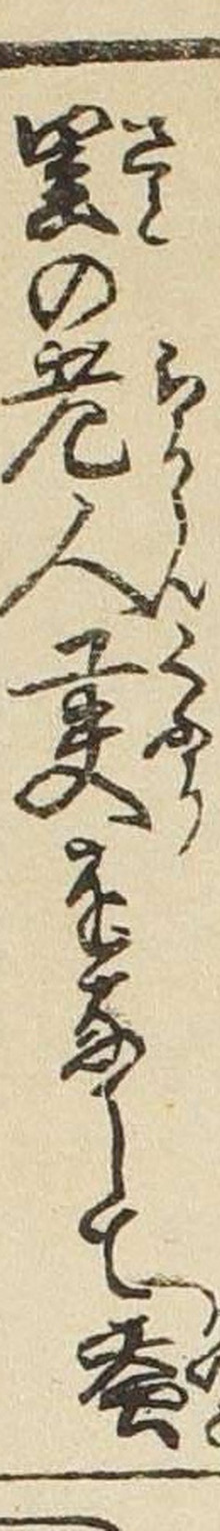里の老人工夫をなして蚕
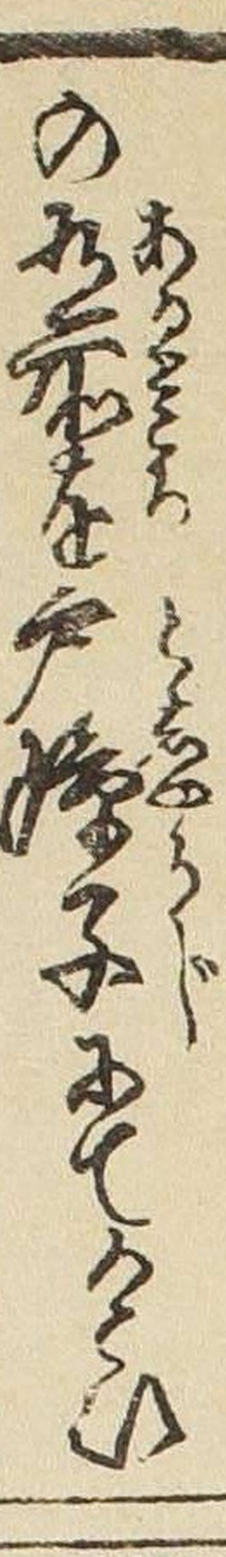の有所を戸障子にてかこひ
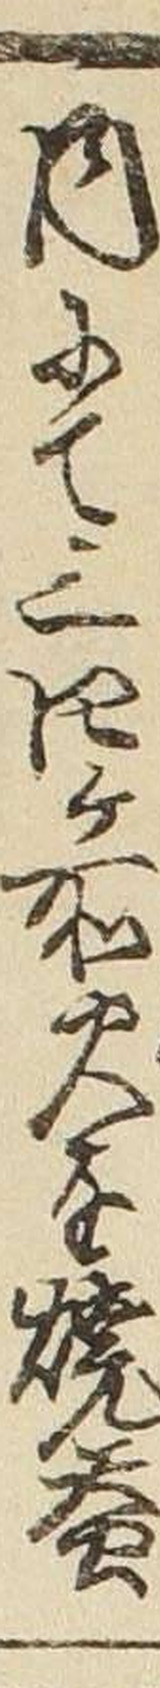内にて三四ヶ所火を焼蚕
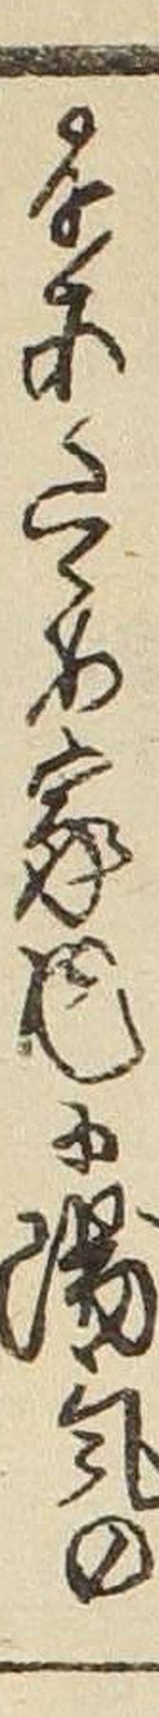をあたゝめ家内に陽気の
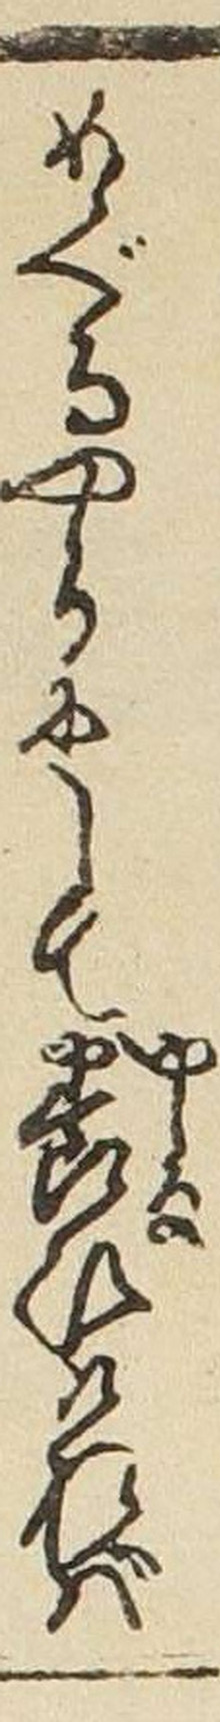めぐるやうにして養ひければ
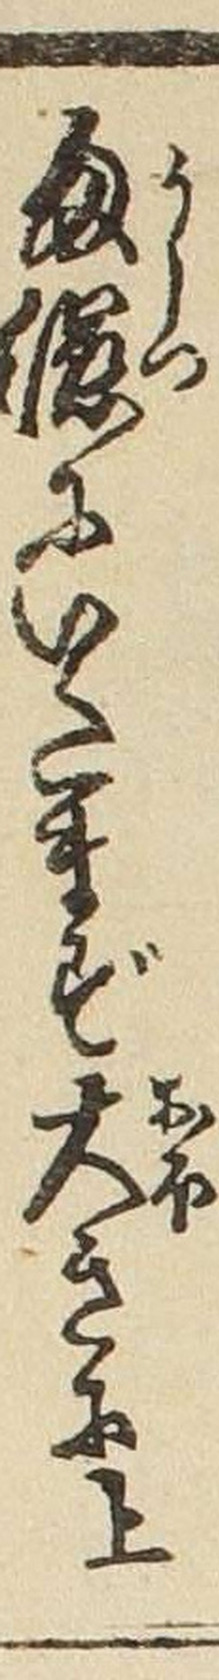雨湿にいたまず大きに上
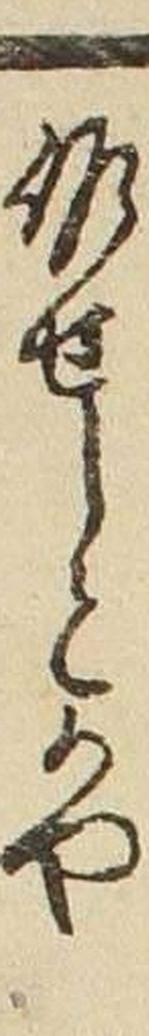作せしとかや

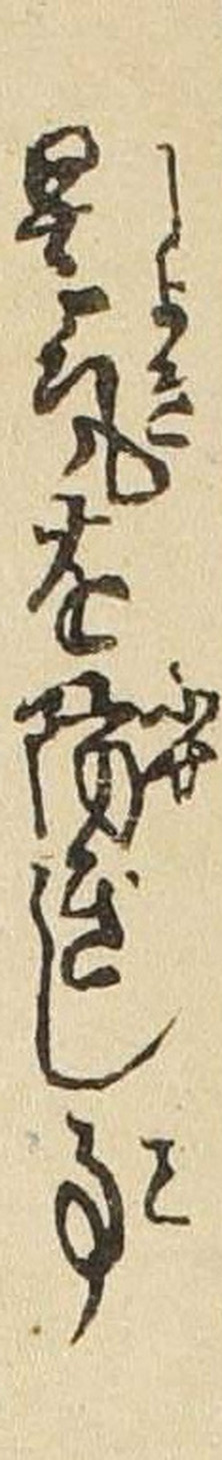暑気を防ぎし事
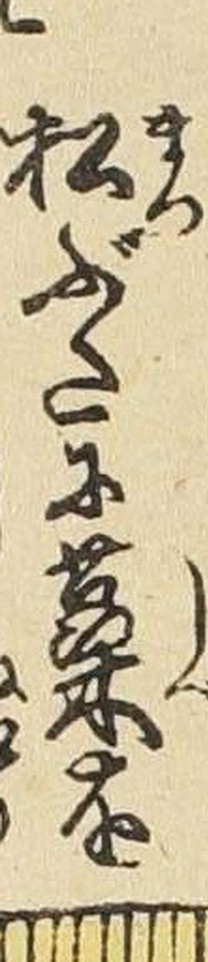松ぶたに蘂を
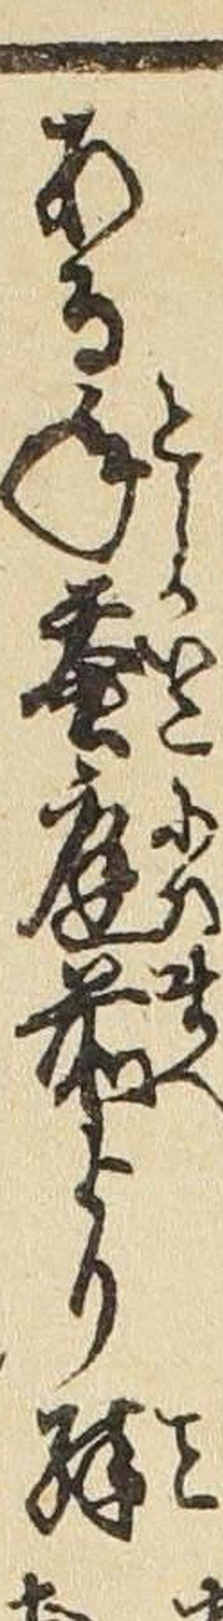ある年蚕庭前より殊
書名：養蠶圖解
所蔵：東京大学農学生命科学図書館 国文学研究資料館
